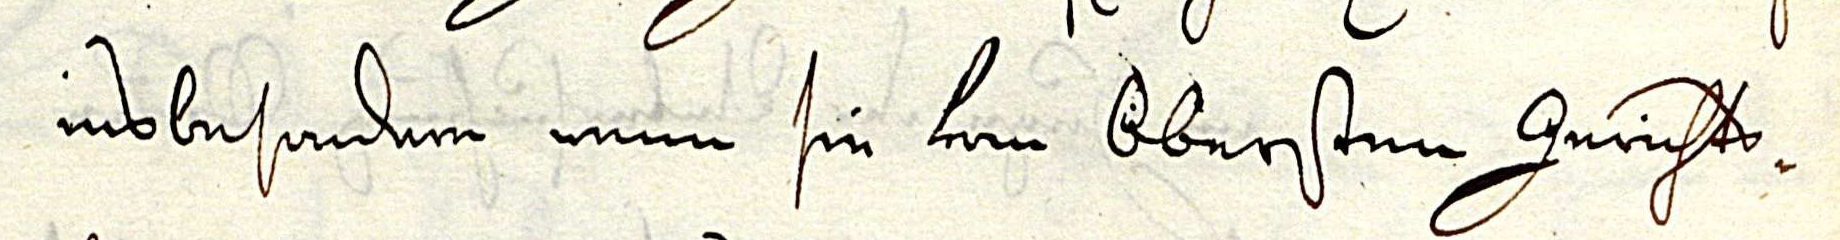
insbesondere wenn sie vom Obersten Gerichts¬
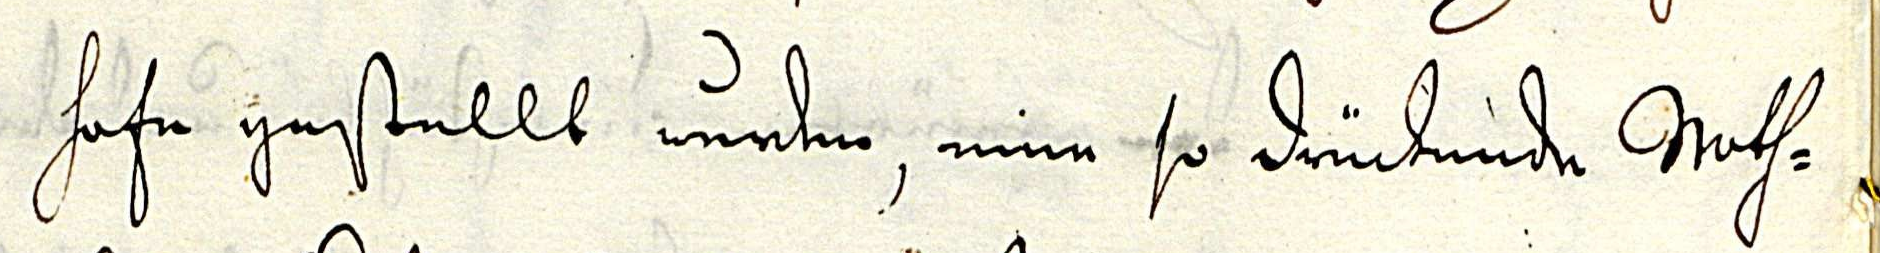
hofe gestellt wurde, eine so drückende Noth¬
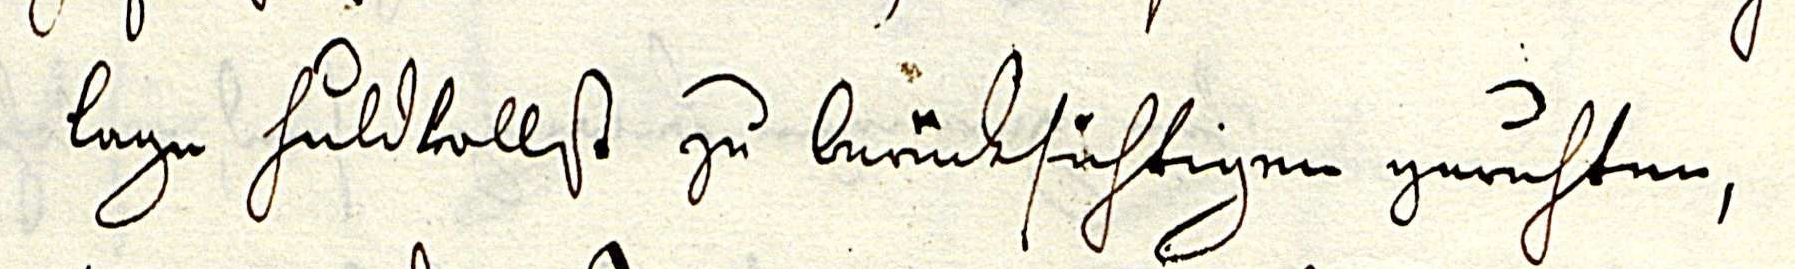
lage huldvollst zu berücksichtigen geruhten,
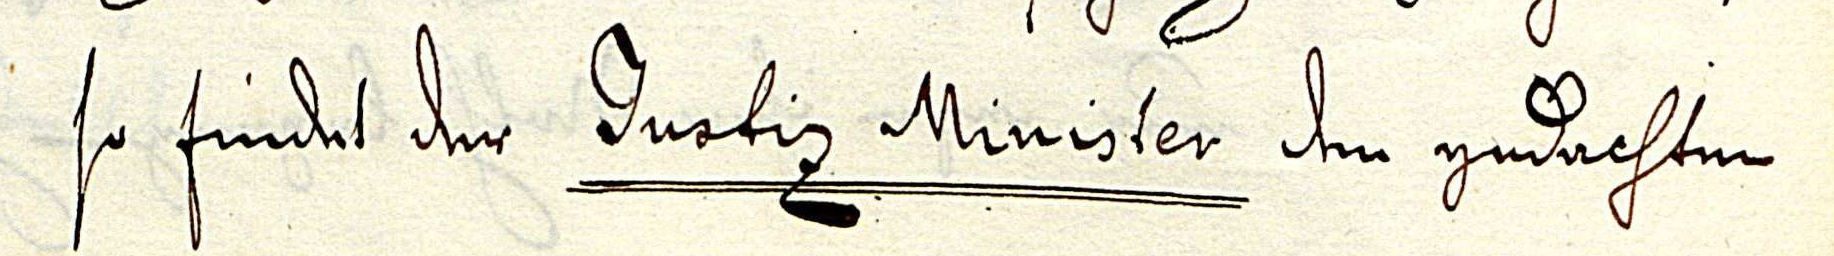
so findet der Justiz Minister den gedachten
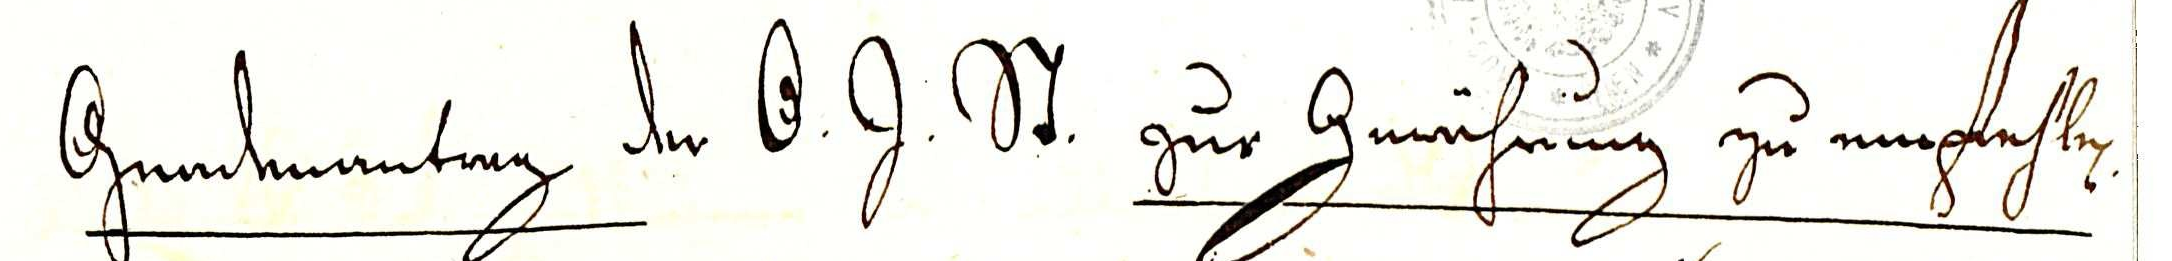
Gnadenantrag der O. J. St. zur Gewährung zu empfehlen.
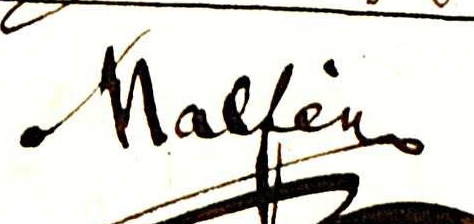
Malfér
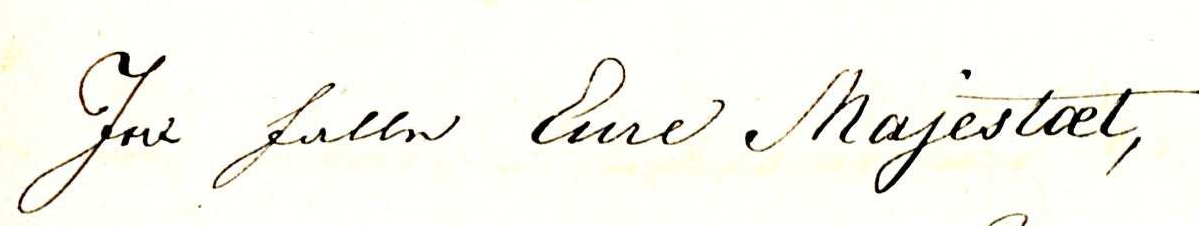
Im Falle Eure Majestaet,
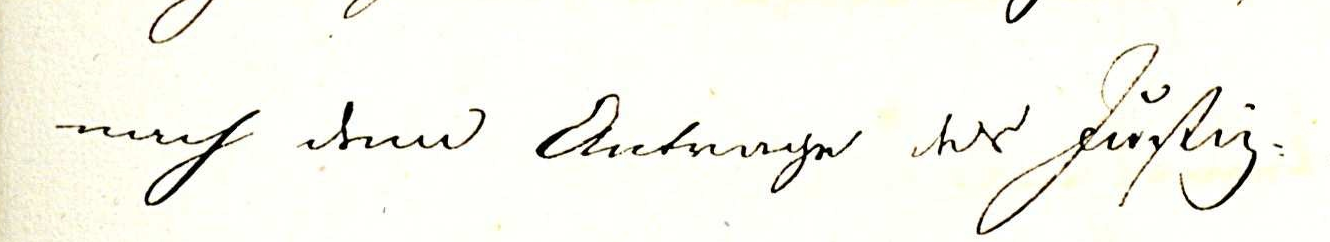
nach dem Antrage der Justiz¬
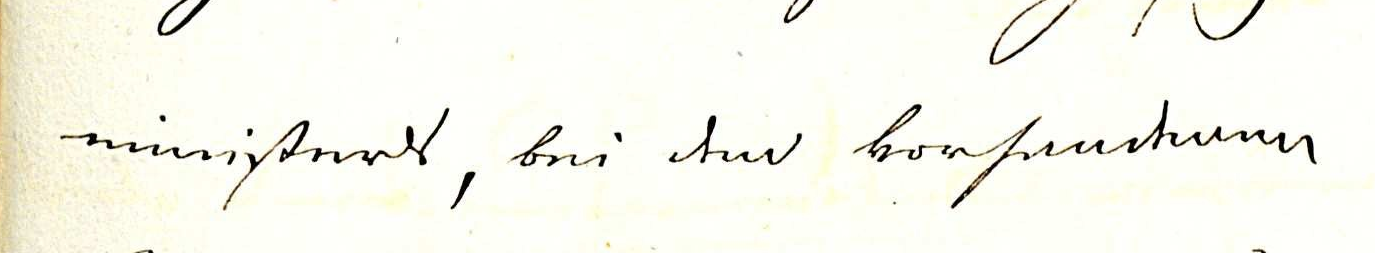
ministers, bei den vorhandenen
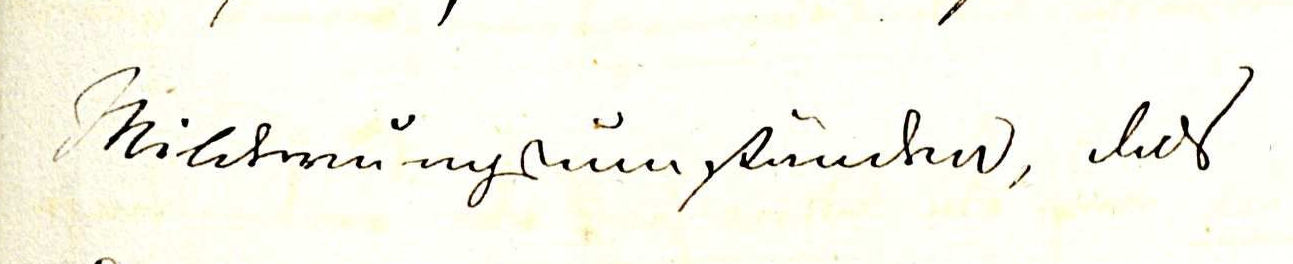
Milderungsumständen, daß
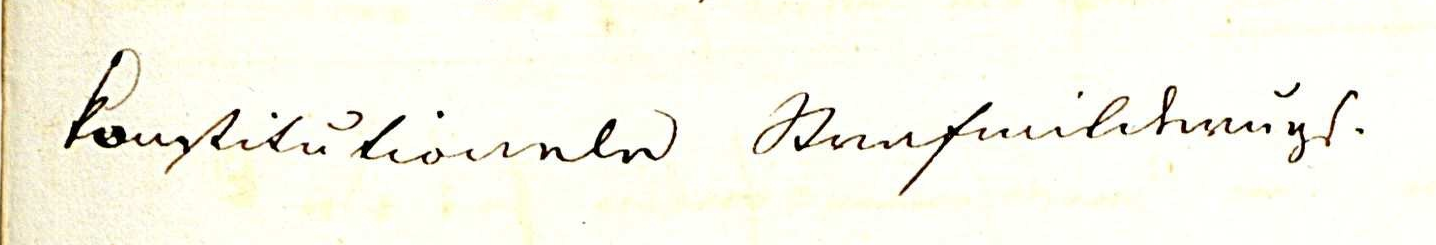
konstitutionele Strafmilderungs¬
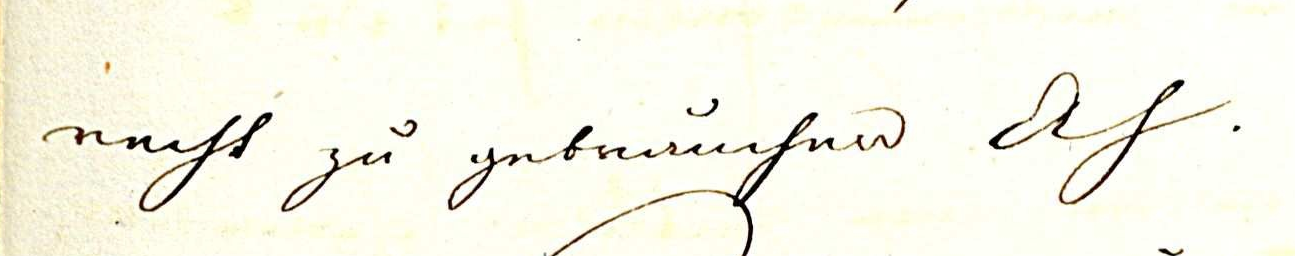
recht zu gebrauchen Ah.
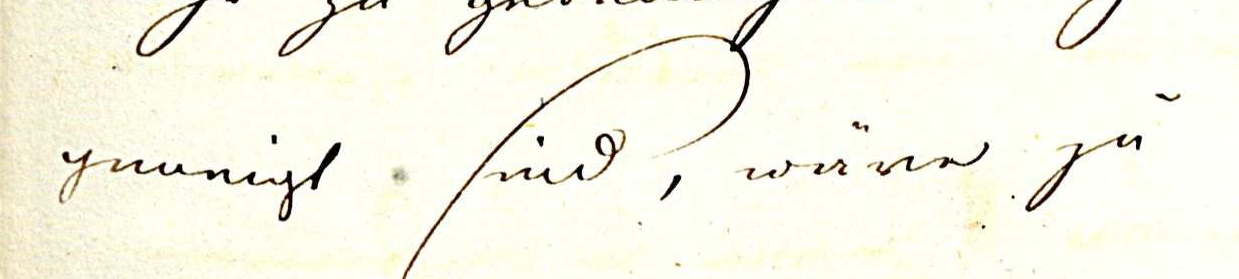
geneigt seid, wären zu
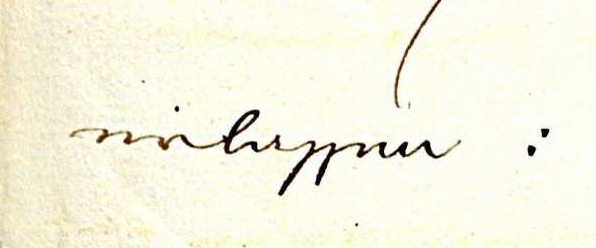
erlassen:
